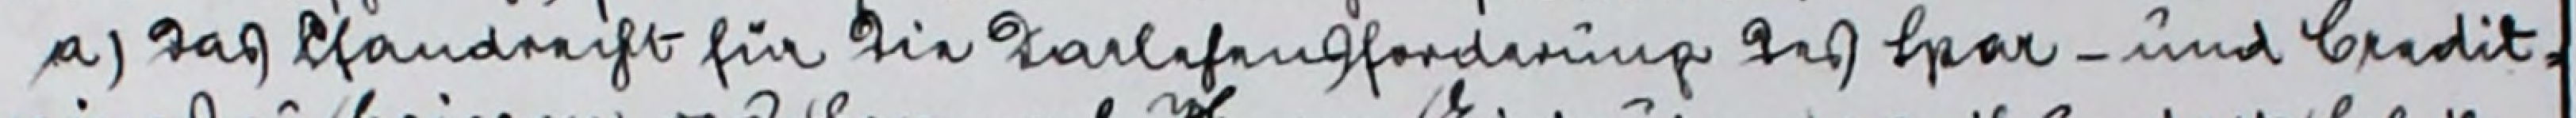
a) das Pfandrecht für die Darlehensforderung des Spar- und Credit=
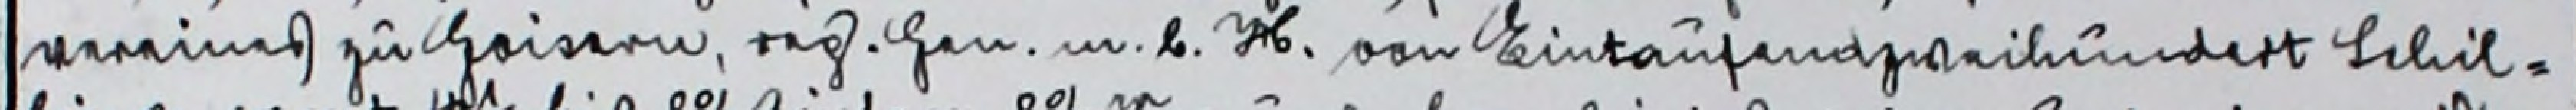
vereines zu Goisern, reg. Gen. m. C. H. von Eintausendzweihundert Schil=
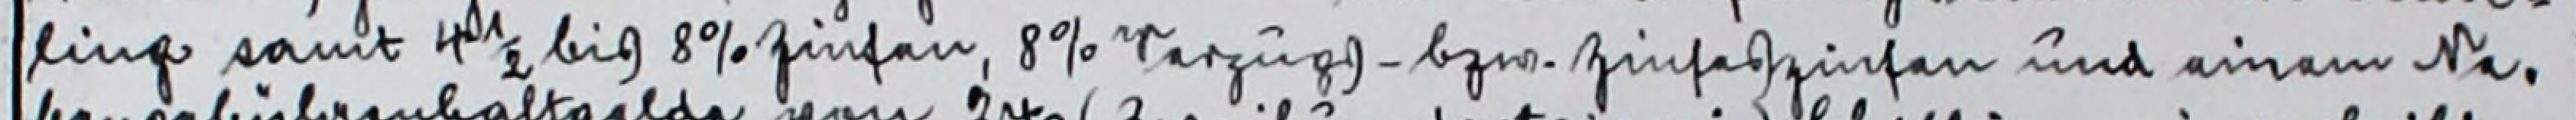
ling samt 4 1/2 bis 8 % Zinsen, 8 % Verzugs - bzw. Zinseszinsen und einem Ne„
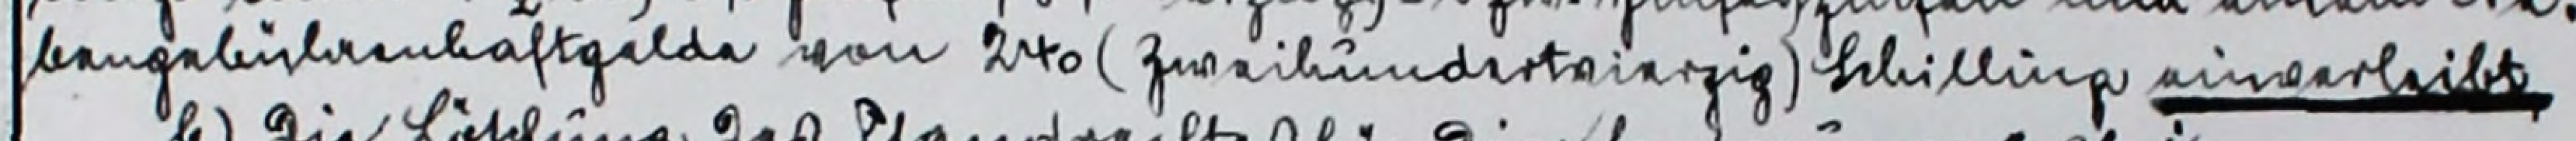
bengebührenhaftgelde von 240 (Zweihundertvierzig) Schilling einverleibt
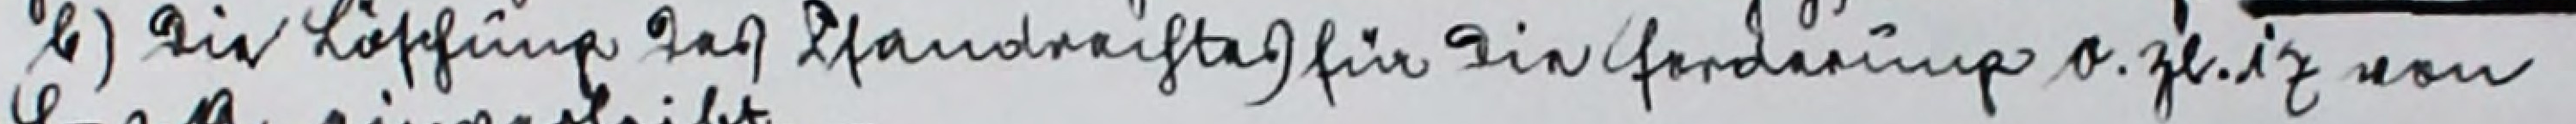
b) die Löschung des Pfandrechtes für die Forderung v. Zl. 17 von
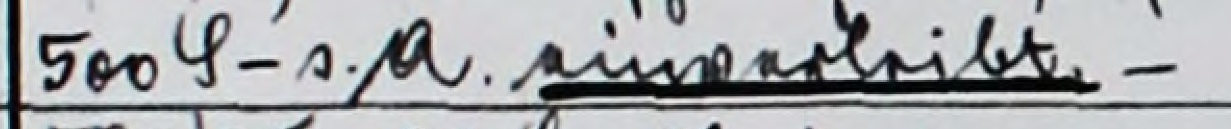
500 S - s.A. einverleibt.-
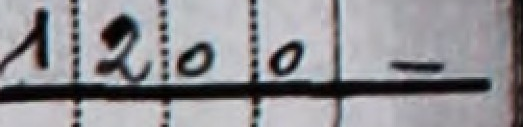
1200 –
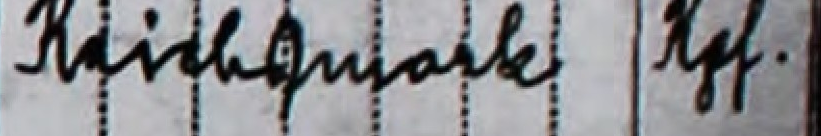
Reichsmark Rpf.
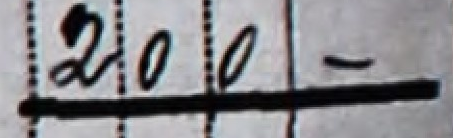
200 –
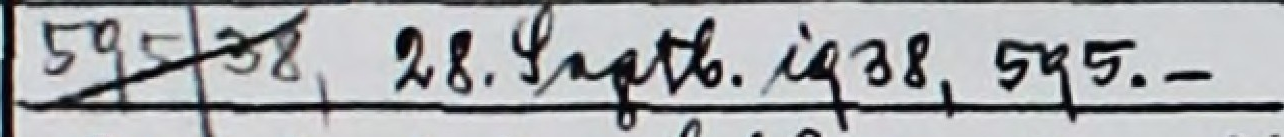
595/38, 28. Septb. 1938, 595.-
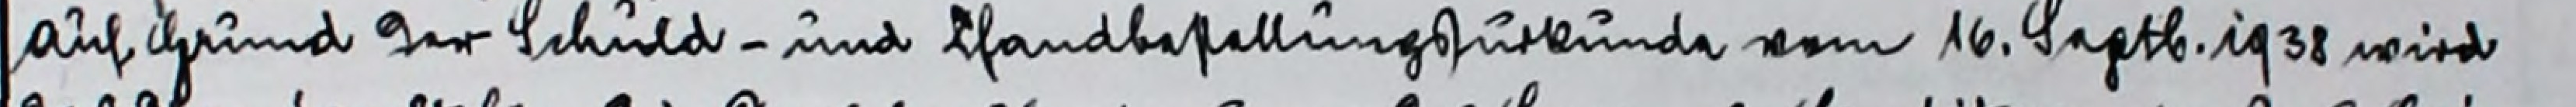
Auf Grund der Schuld - und Pfadbestellungsurkunde vom 16. Septb. 1938 wird
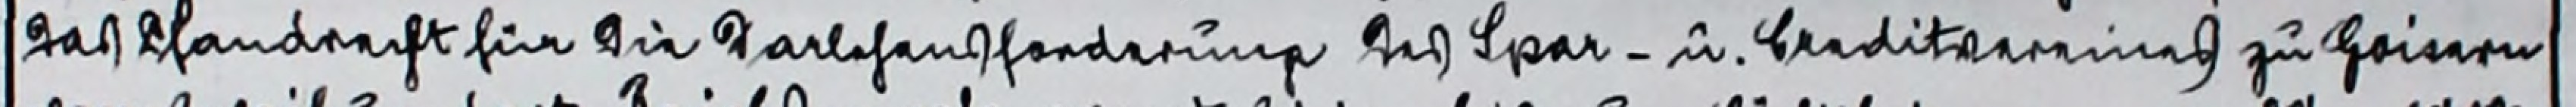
das Pfandrecht für die Darlehensforderung des Spar - u. Creditvereines zu Goisern
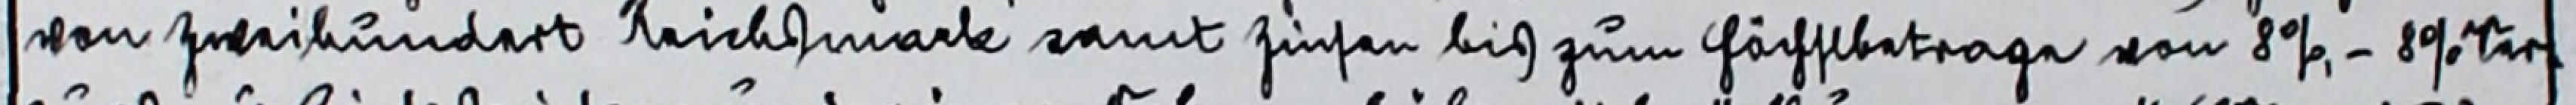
von Zweihundert Reichsmark samt Zinsen bis zum Höchstbetrage von 8 % - 8 % Ver„
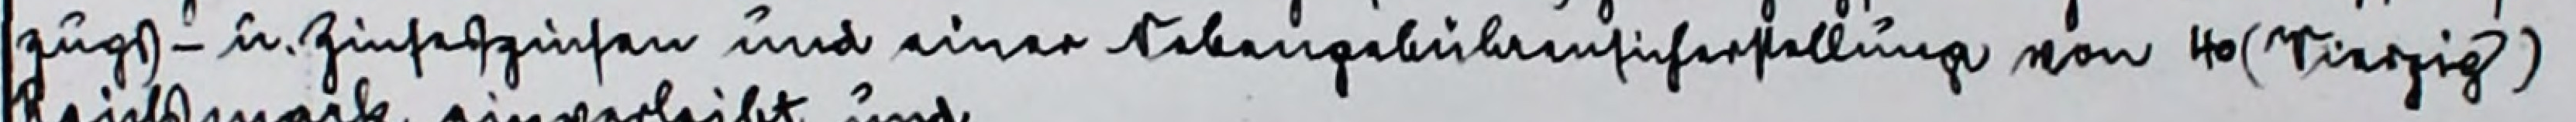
zugs - u. Zinseszinsen und einer Nebengebührensicherstellung von 40 (Vierzig)
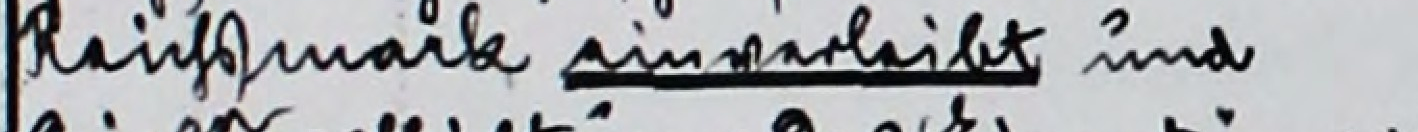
Reichsmark einverleibt und
